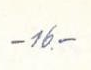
16
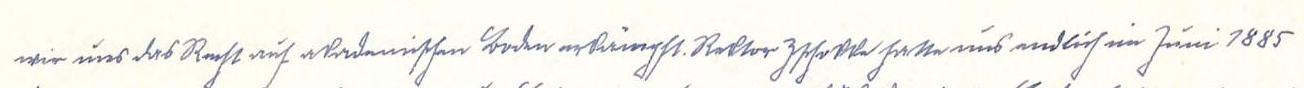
wir uns das Recht auf akademischen Boden erkämpft. Rektor Zschokke hatte uns endlich im Juni 1855
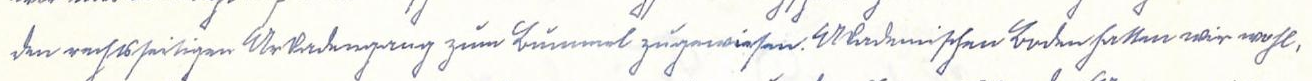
den rechtsseitigen Arkadengang zum Bummel zugewiesen. Akademischen Boden hatten wir wohl,
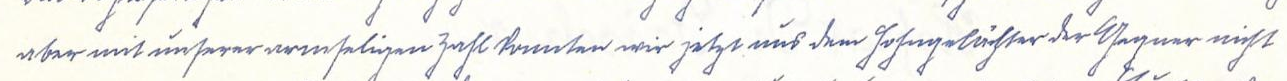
aber mit unserer armseligen Zahl konnten wir jetzt uns dem Hohngelächter der Gegner nicht
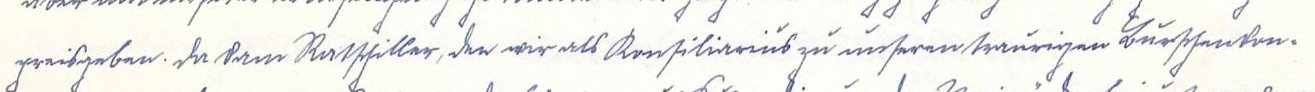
preisgeben. Da kam Ratschiller, den wir als Konziliarius zu unseren traurigen Burschenkon-
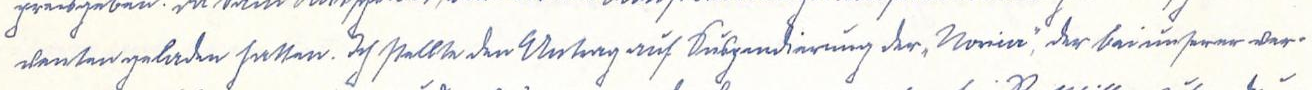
venten geladen hatten. Ich stellte den Antrag auf Suspendierung der Norica, der bei unserer ver-
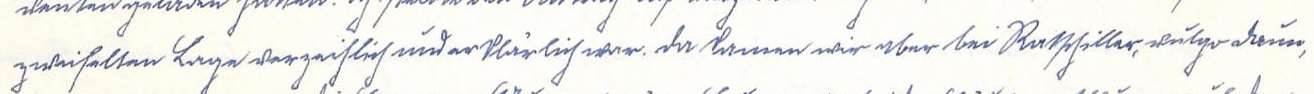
zweifelten Lage verzeihlich und erklärlich war. Da kamen wir aber bei Ratschiller, vulgo Daun
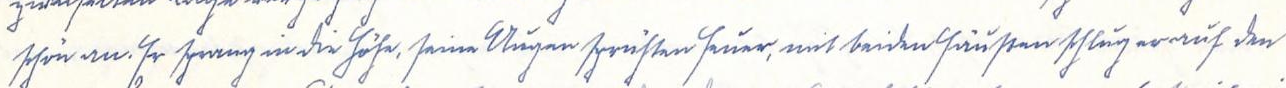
schön an. Er sprang in die Höhe, seine Augen sprühten Feuer, mit beiden Fäusten schlug er auf den
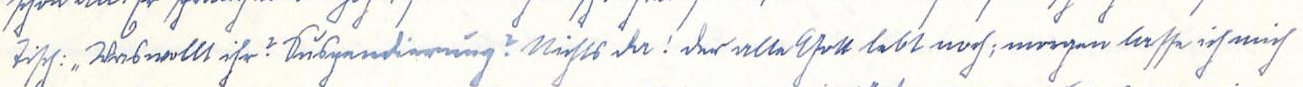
Tisch: „Was wollt Ihr? Suspendierung? Nichts da! Der alte Gott lebt noch, morgen lasse ich mich
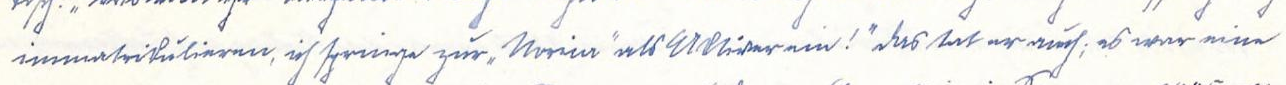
immatrikulieren, ich springe zur „Norica“ als Archivar ein!“ Das tat er auch; es war eine
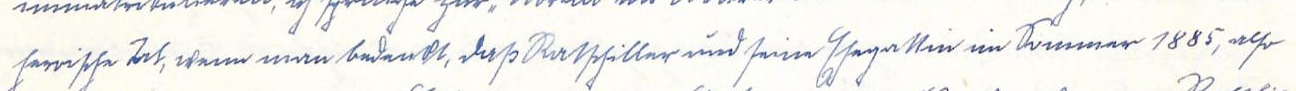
heroische Tat, wenn man bedenkt, dass Ratschiller und sein Ehegatte im Sommer 1885, also
